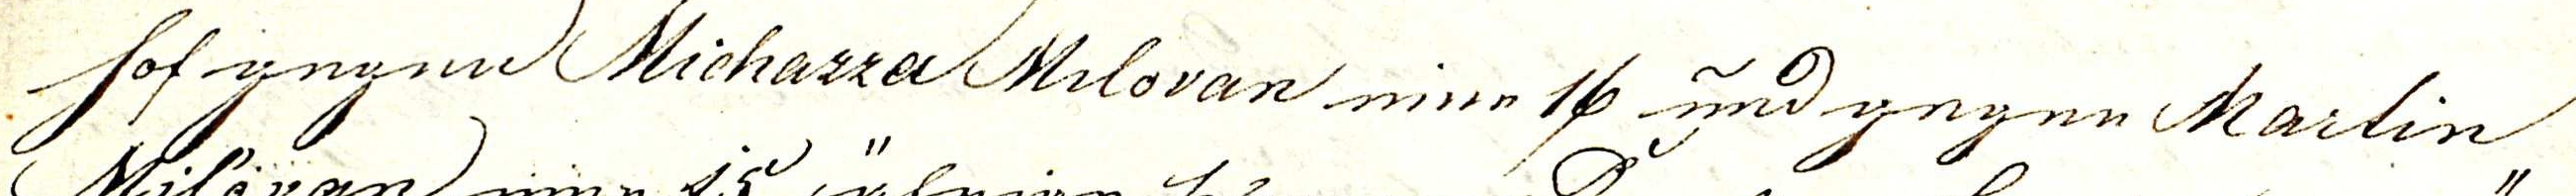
hof gegen Michazza Milovan eine 16 und gegen Martin
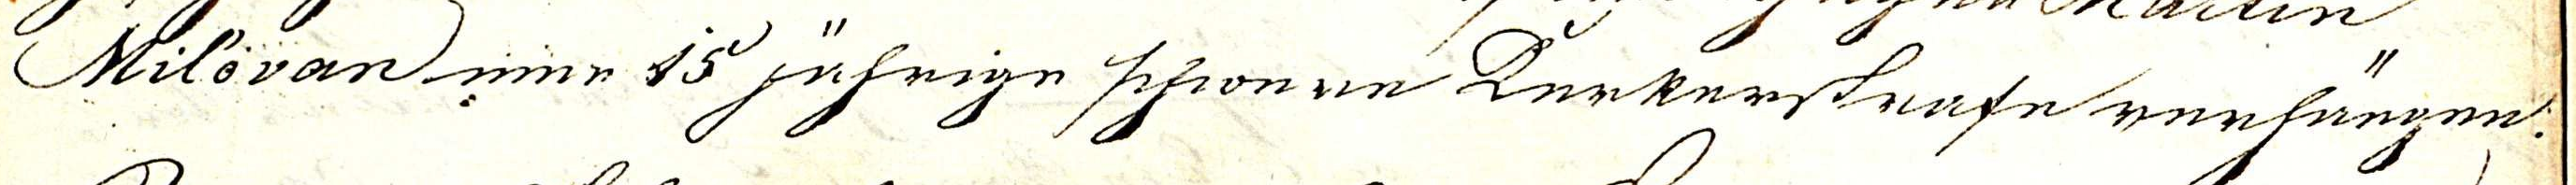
Milovan eine 15 jährige schwere Kerkerstrafe verhängen.
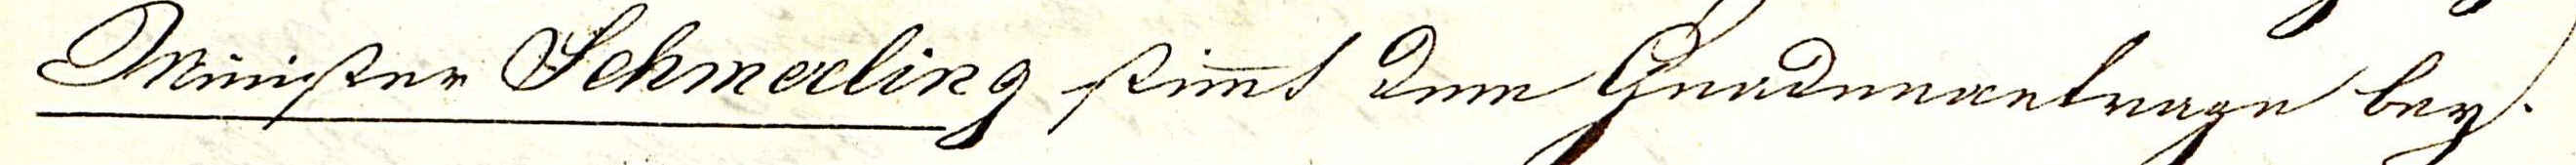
Minister Schmaling stimmt dem Gnadenantrage bez.
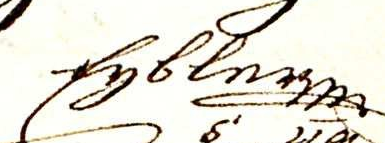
Eyblerxx
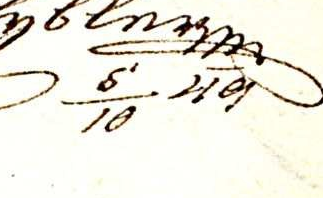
5/10 49
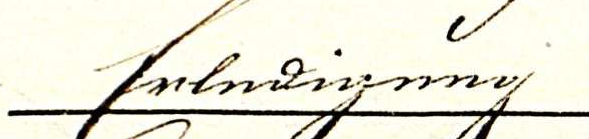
Erledigung
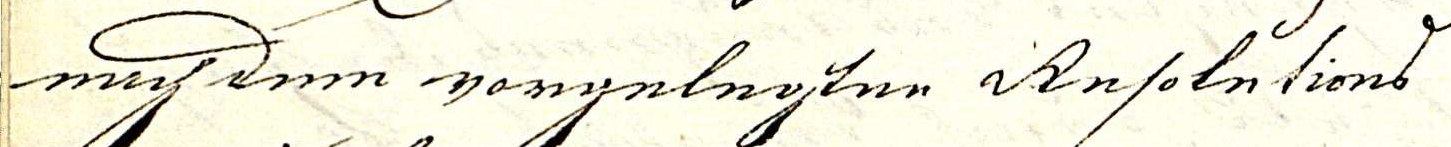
nach dem vorgelegter istesolutions
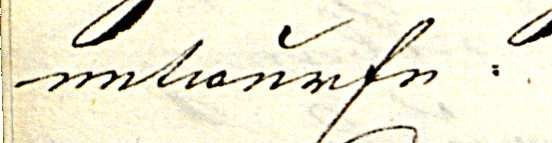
entwurfe.
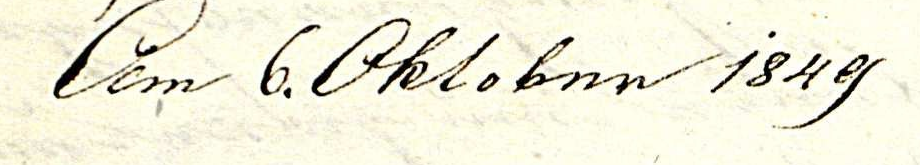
Am 6. Oktober 1849
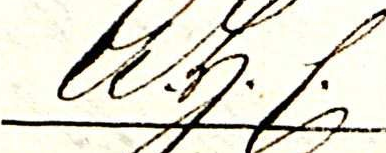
A. H. E.
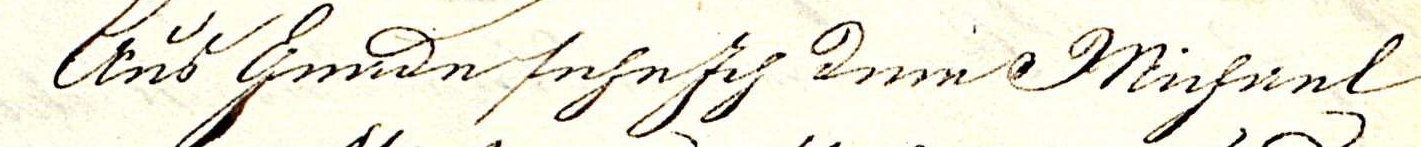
Aus Gnade sehe Ich dein Michael
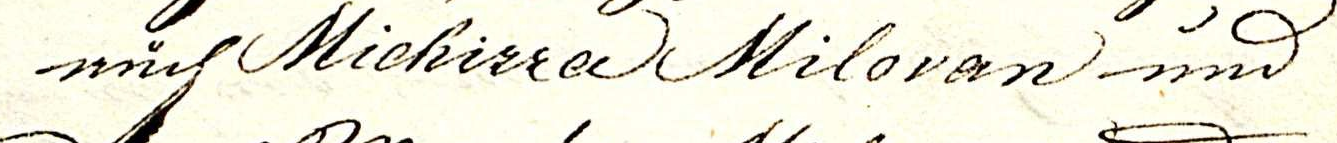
auch Michizza Milovan und
